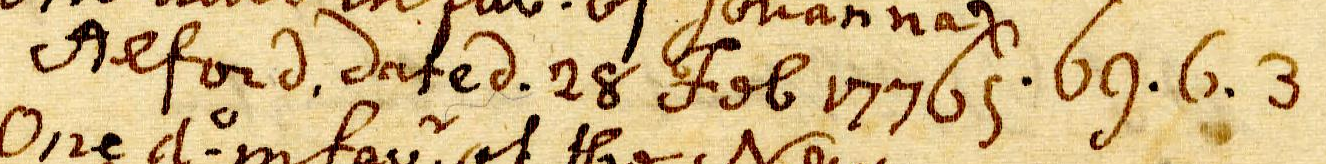Alford, dated 28 Feb 1776. 69.6.3
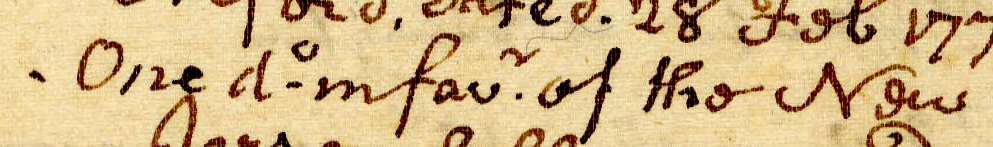One d^o. in fav^t. of the New
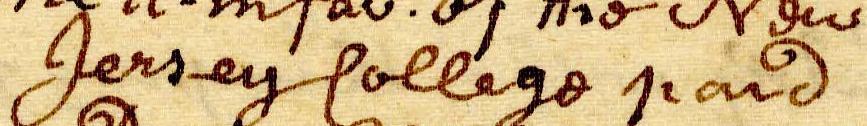Jersey College paid
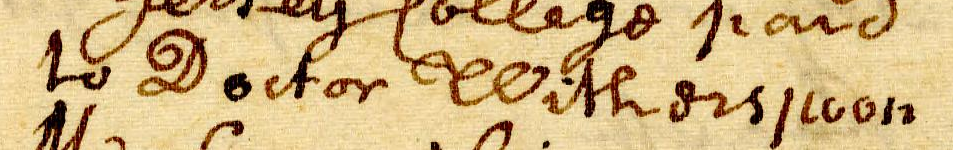to Doctor Witherspoon
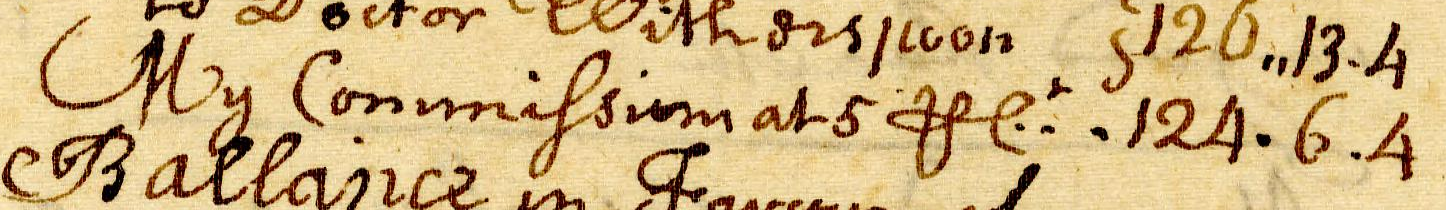My Commistion at 6 9 C.. 124. 6.4
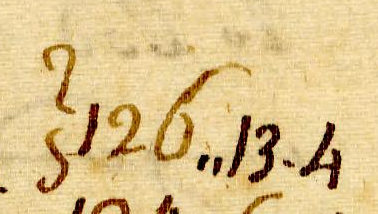126..13.4
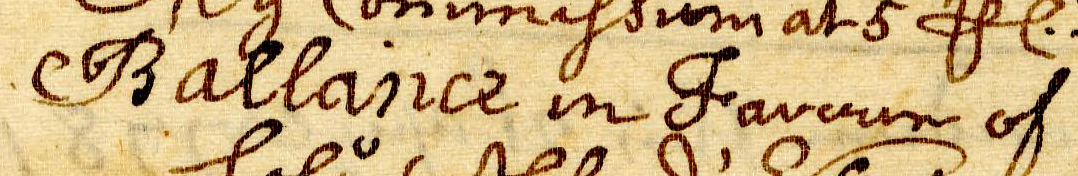Ballance in Favour of
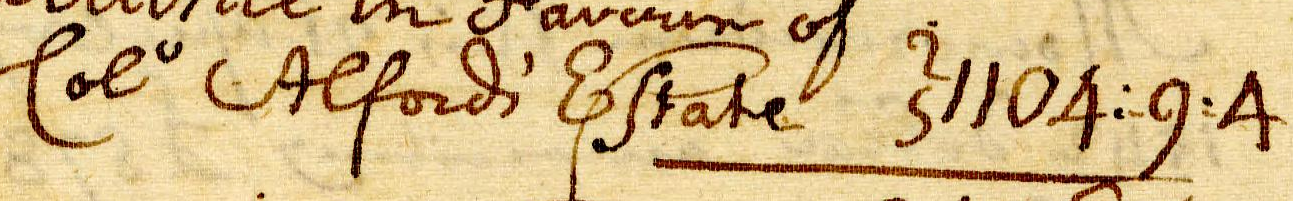Col^o. Alford's Estate 1104:9:4
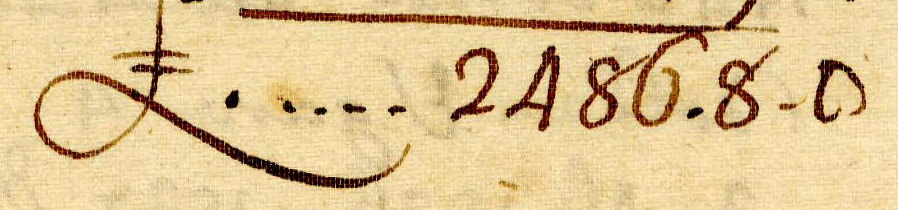£..... 2486.8.0
